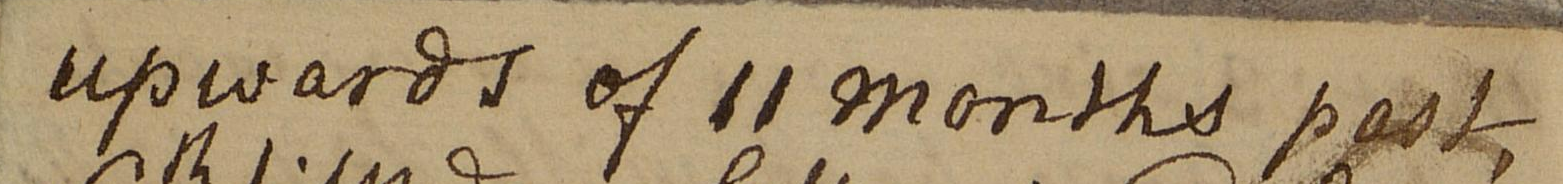upwards of 11 months past,
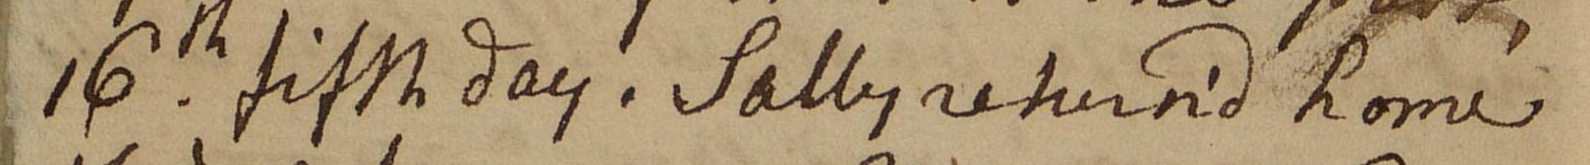16^th. fifth day. Sally return'd home
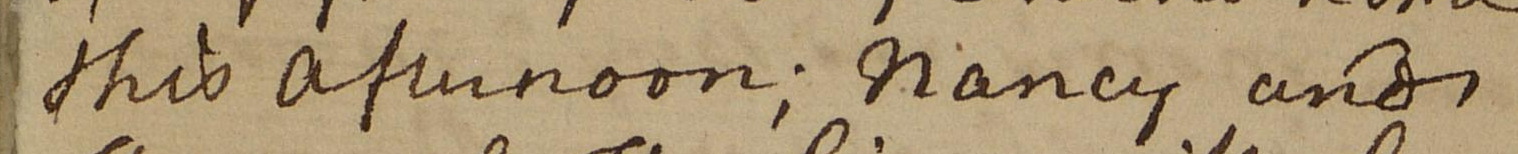this afternoon; Nancy and
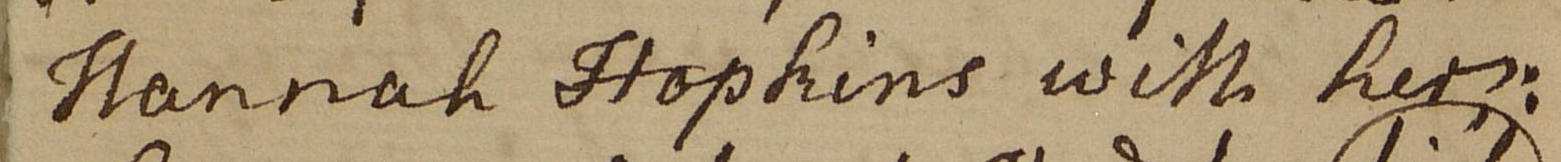Hannah Hopkins with her:
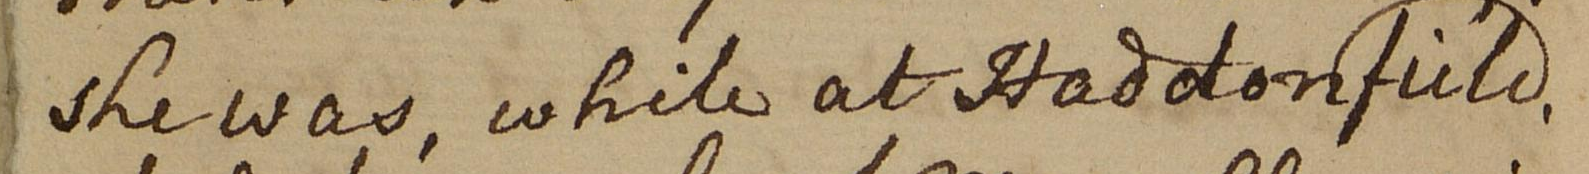she was while at Haddonfield,
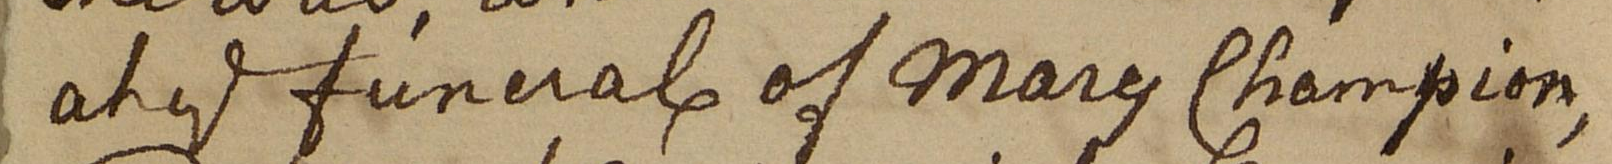at y^e funeral of Mary Champion,
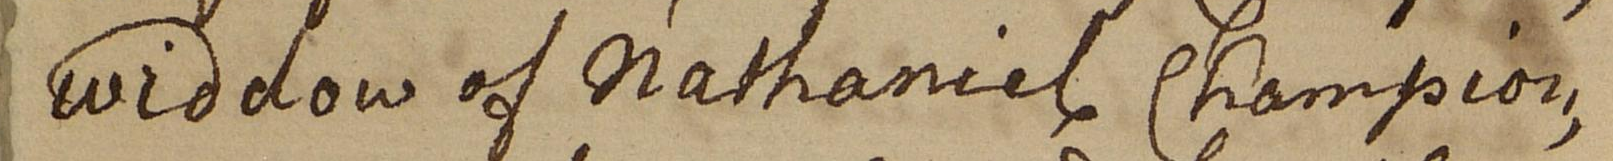Widdow of Nathaniel Champion,
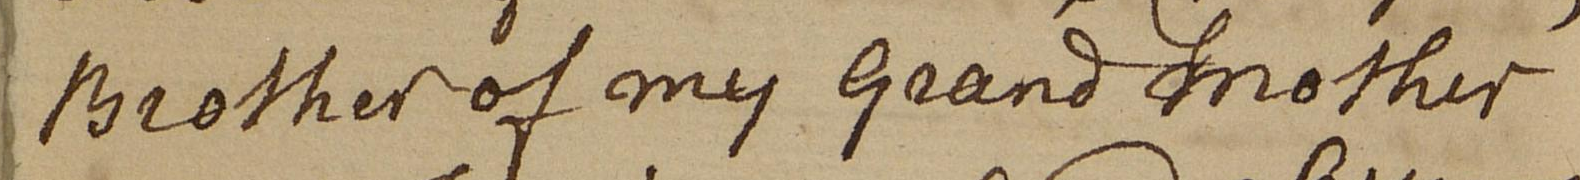Brother of my Grand Mother
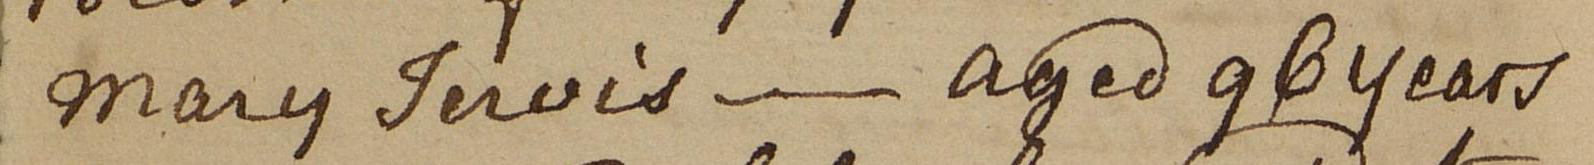Mary Jervis- aged 96 years
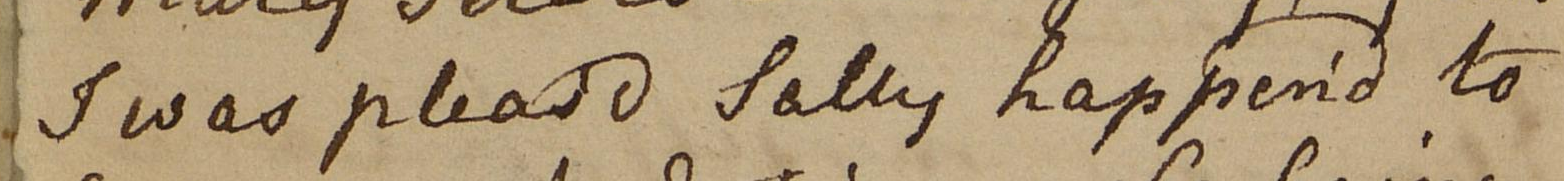I was pleasd Sally happen'd to
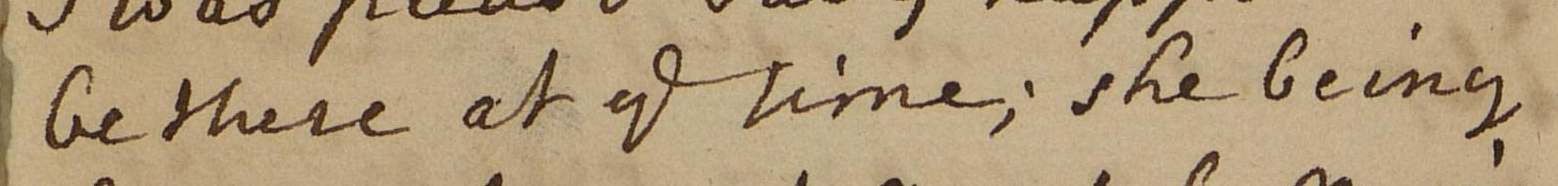be there at y^e time; she being
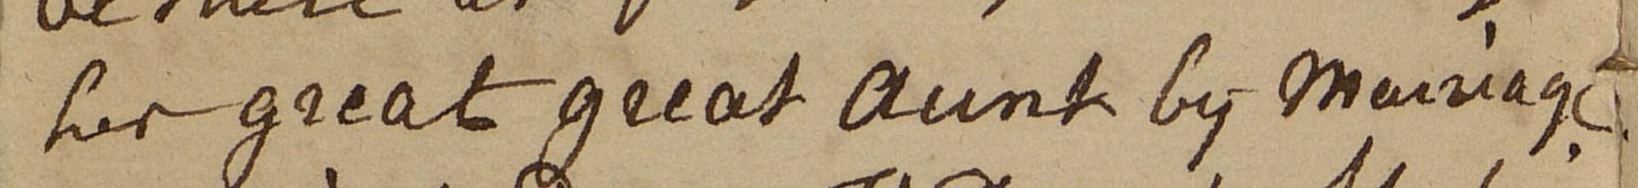her great great Aunt by Marriage
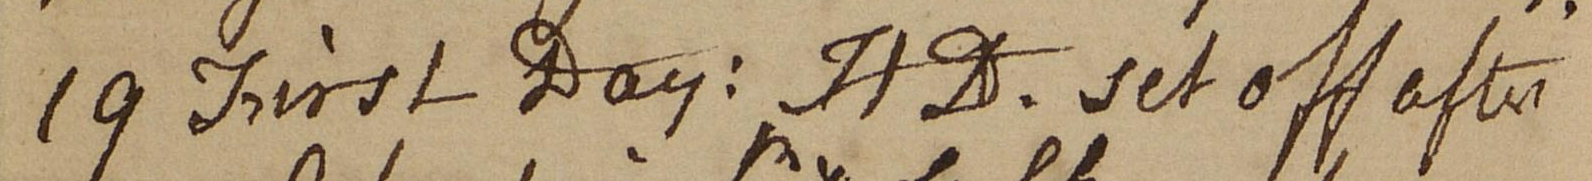19 First Day: H D. set off after
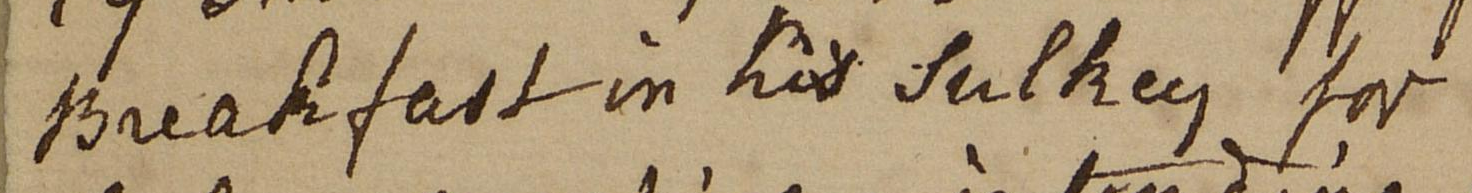Breakfast in his Sulkey for
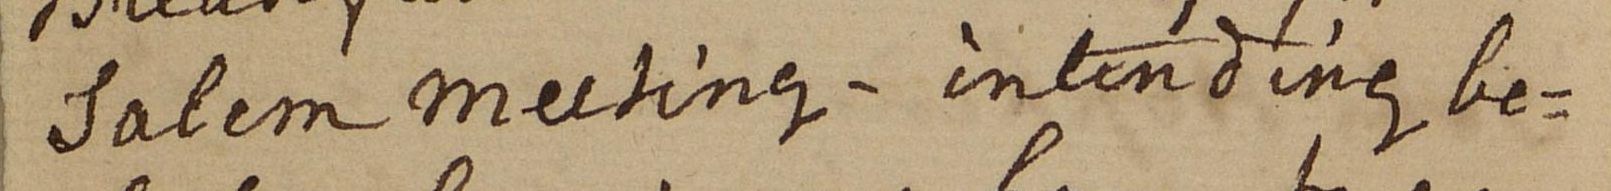Salem meeting- intending be-
